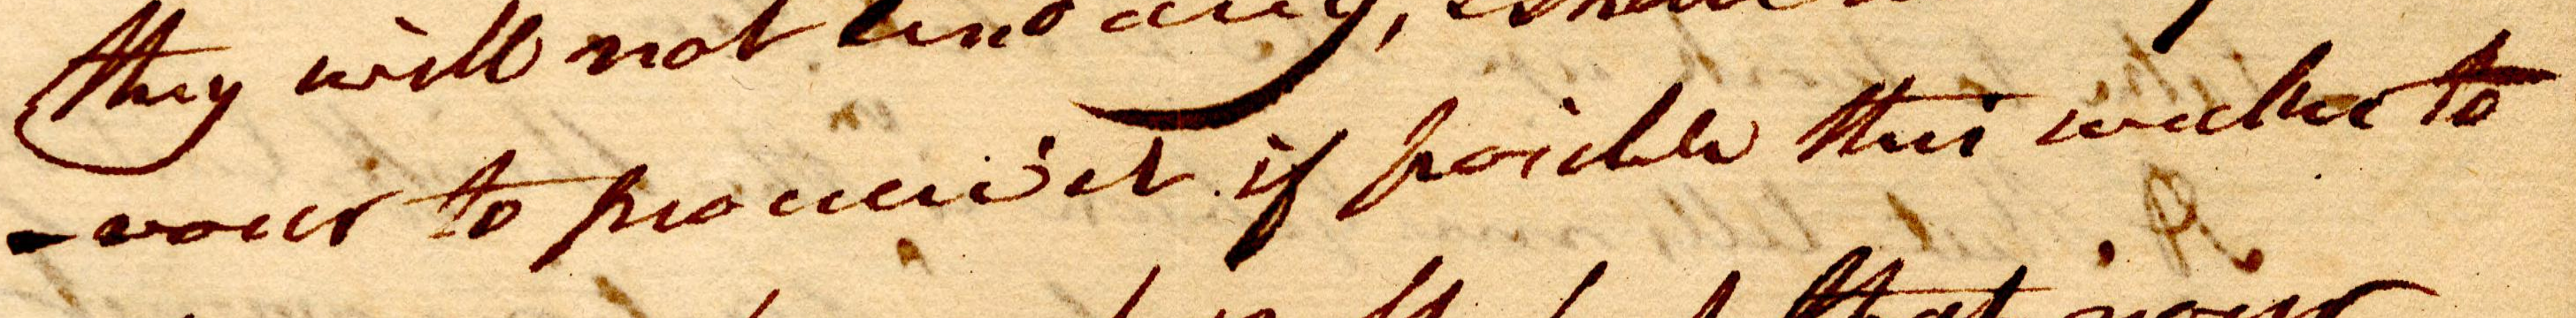-vour to procure it if possible this weeke to
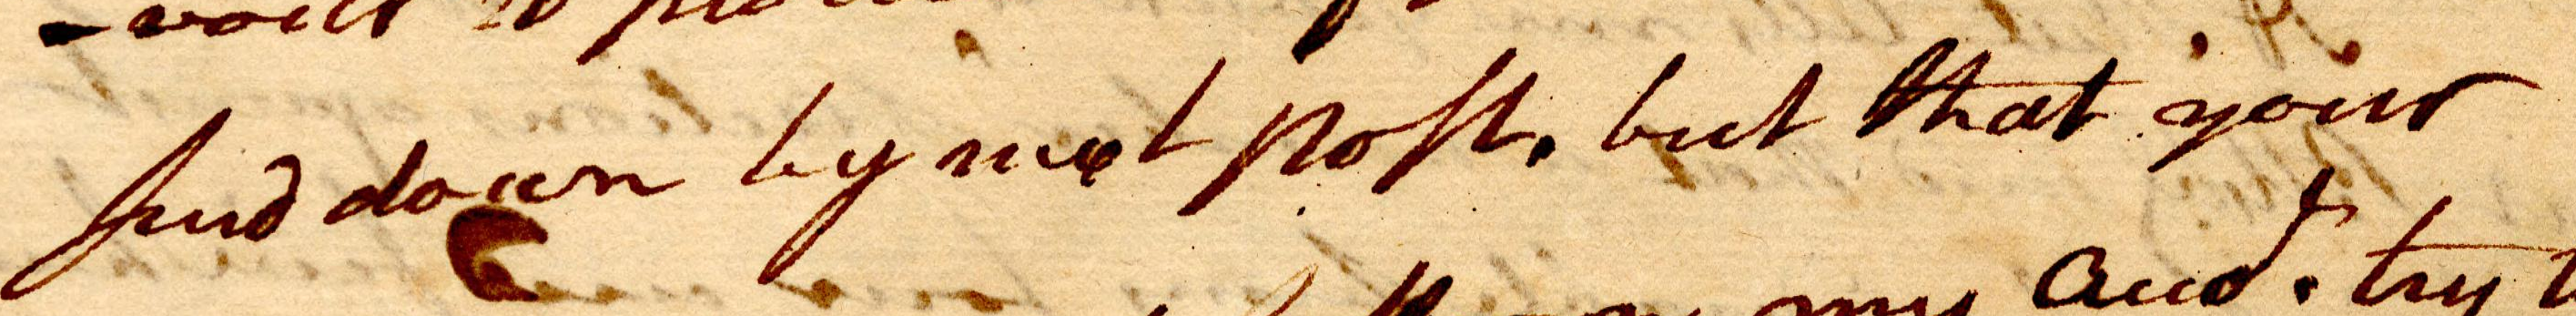find down by most profit, but that your
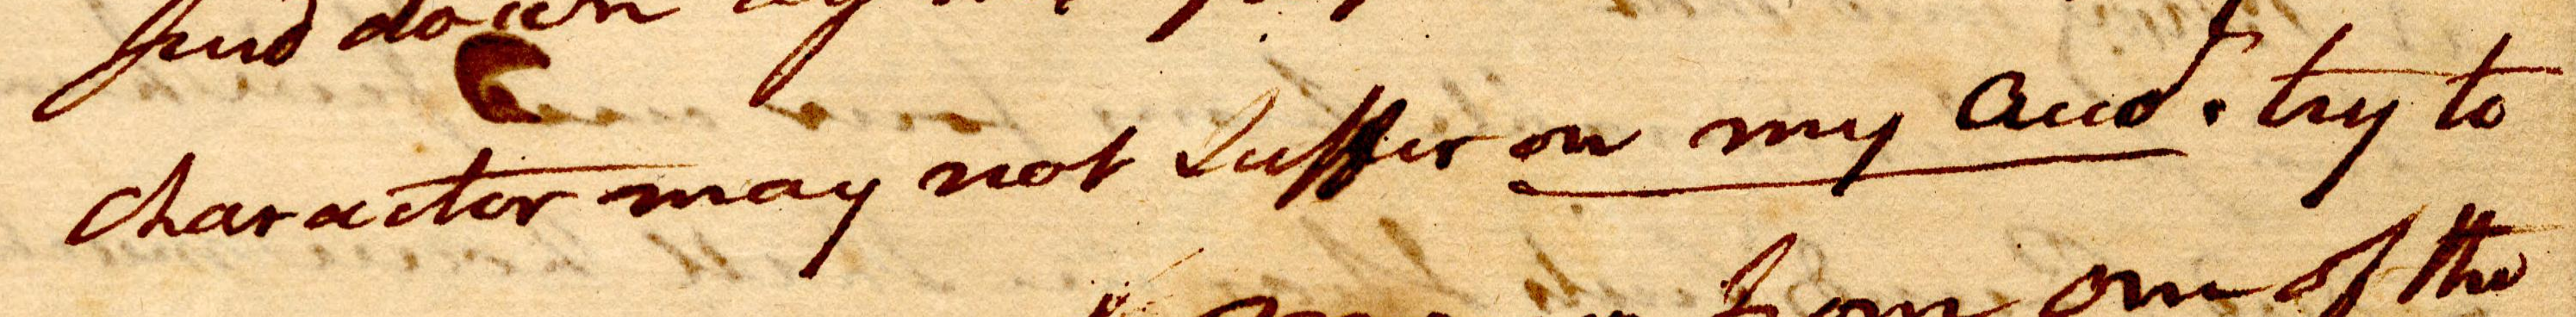character may not suffer on my Acco^t try to
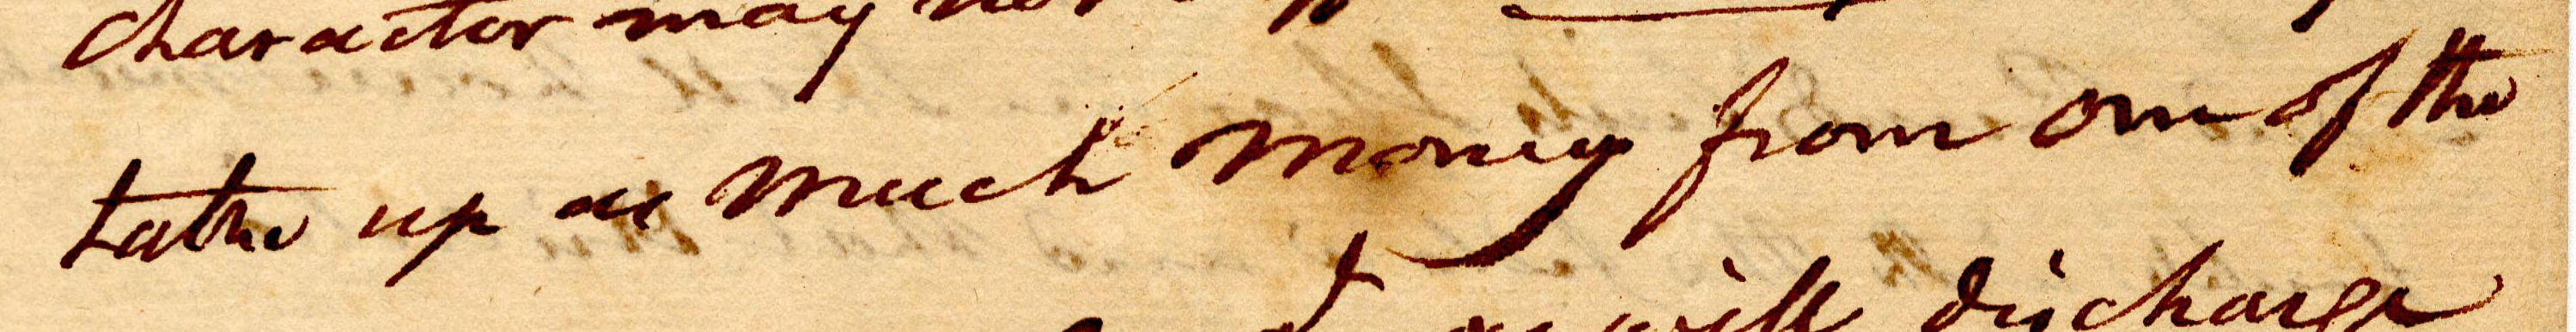take up as much money from one of the
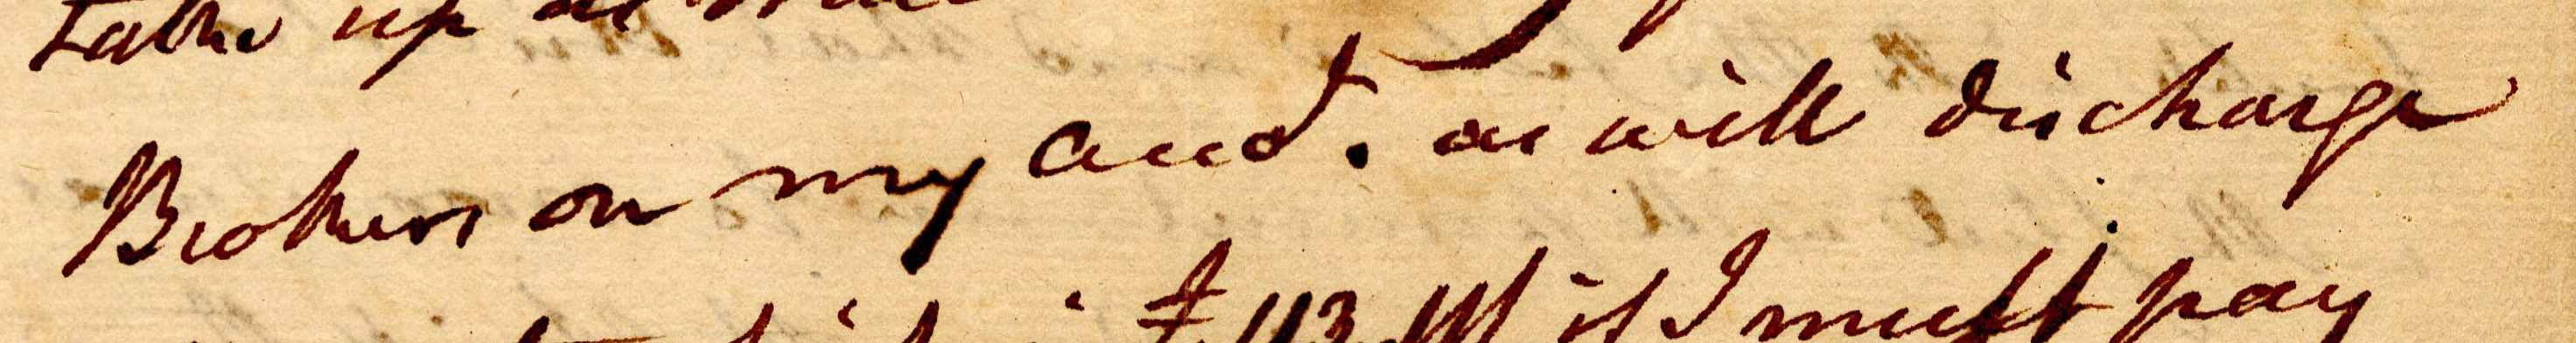Brokers on my acco^t as will discharge
